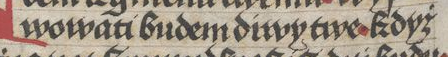wowati budem diwy twe.kdyż
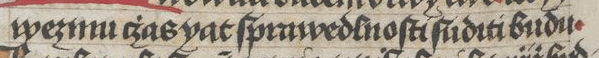wezmu cżas yat ſprawedlnoſti ſuditi budu.
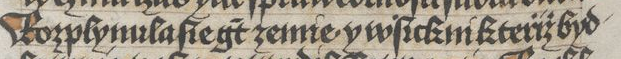Rozplynula ſie ḡt zemie.y wẛickni kteṙiż byd¬
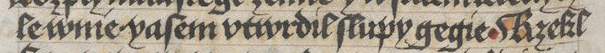le wníe.yaſem vtwrdil ſlupy gegíe.Rzekl
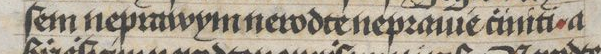ſem neprawym nerodte neprauíe ċiniti.a
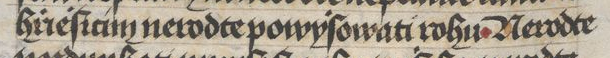hṙieẛicím nerodte powyẛowati rohu.Nerodte
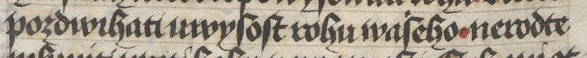pozdwihati u wyſoſt rohu waẛeho.nerodte
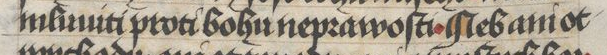mluuiti proti bohu neprawoſti.Neb ani ot¬
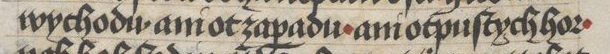wychodu.ani ot zapadu.ani otpuſtych hor.
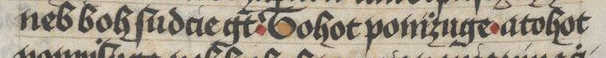neb boh ſudcie ḡt.Tohot poniżuge.a tohot
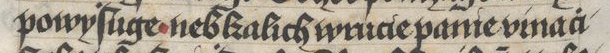powyẛuge.neb kalich wrucie panie vína ċi¬
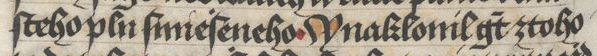ſteho pln ſmieẛeneho.Ynaklonil ḡt ztoho¬
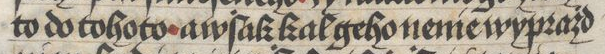to do tohoto.awẛak kal geho neníe wyprażd¬
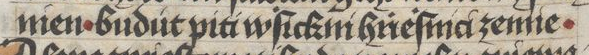nien.budút piti wẛickni hṙieſníci zemie.
